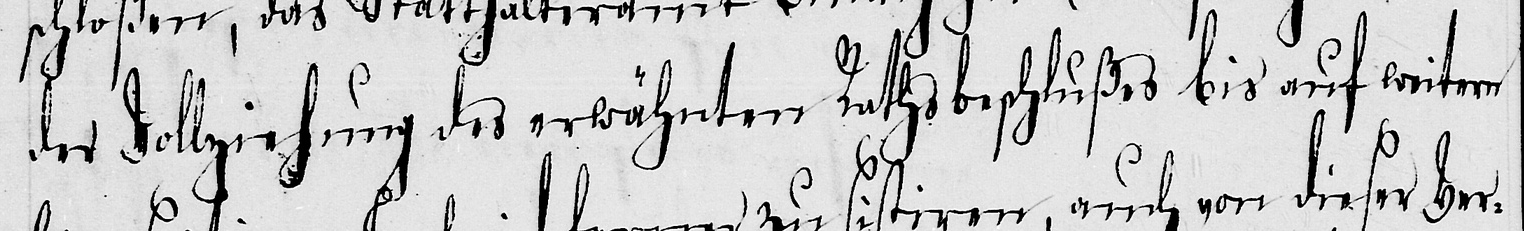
der Vollziehung des erwähnten Rathsbeschlußes bis auf weite¬
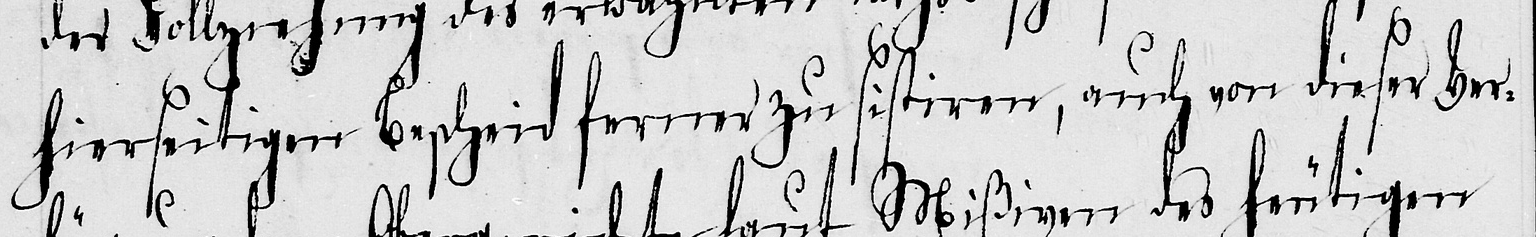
hierseitigen Bescheid ferner zu sistiren, auch von dieser Ver¬
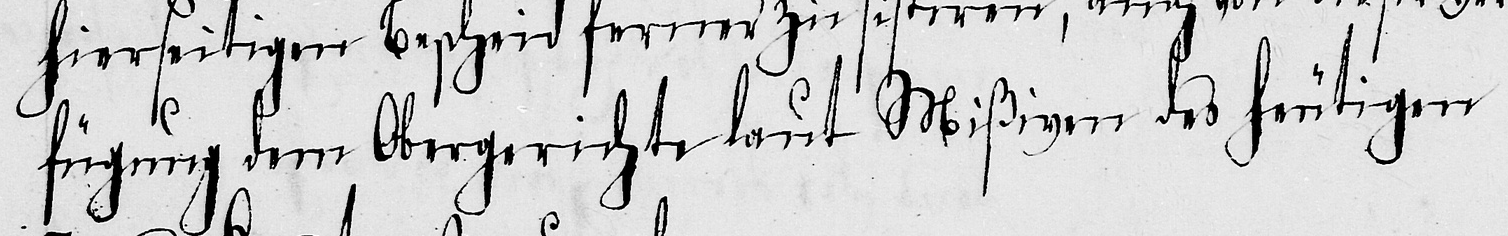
fügung dem Obergerichte laut Mißiven des heutigen
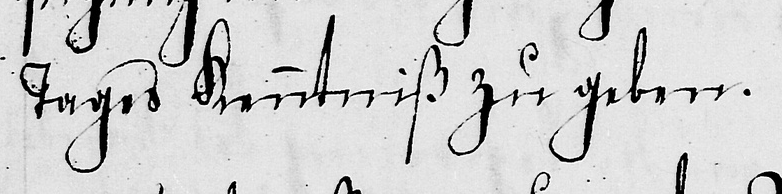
Tages Kenntniß zu geben.
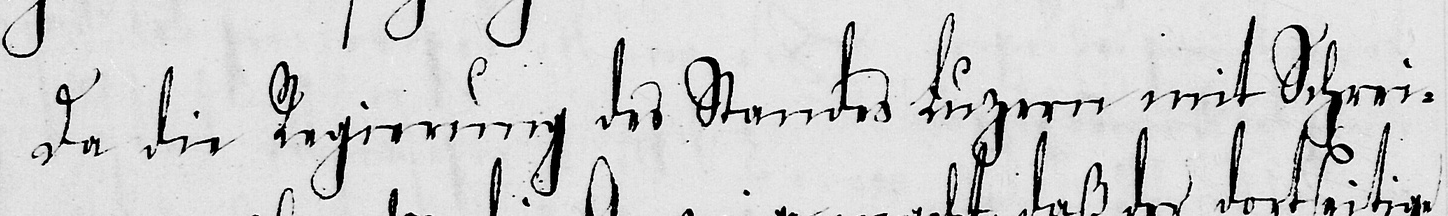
Da die Regierung des Standes Luzern mit Schrei¬
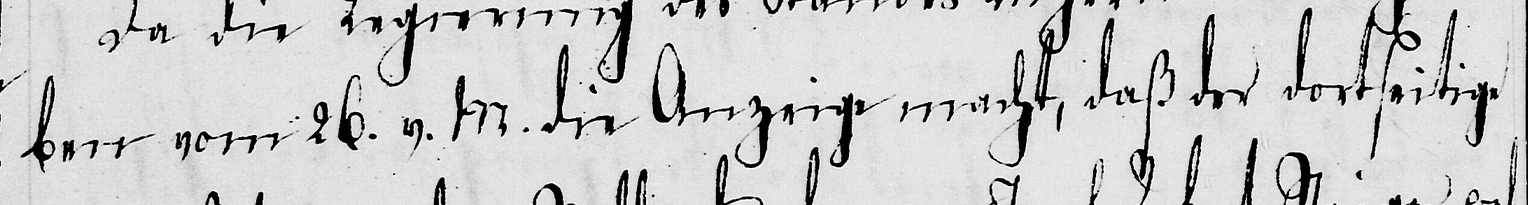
ben vom 26. v. M. die Anzeige macht, daß der dortseitige
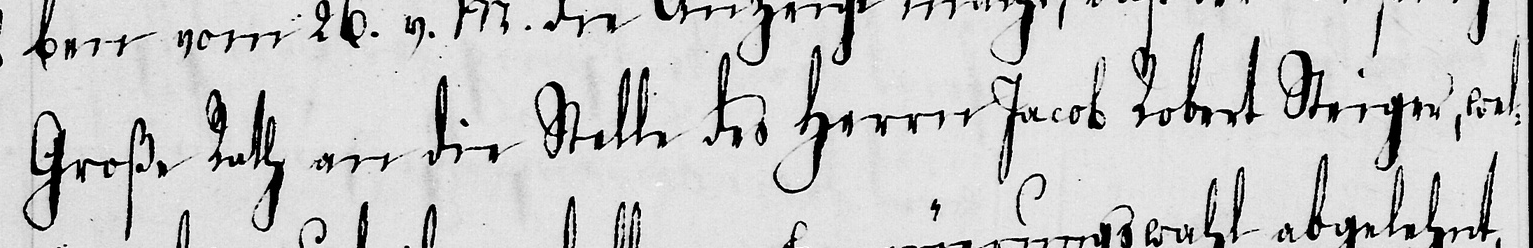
Große Rath an die Stelle des Herrn Jacob Robert Steiger, we¬
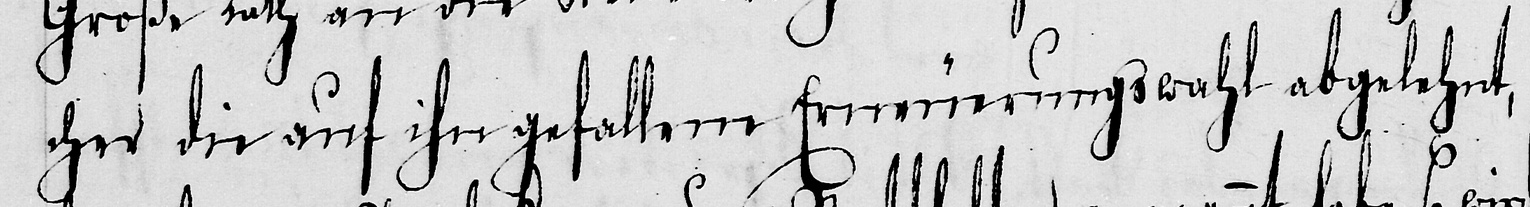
lcher die auf ihn gefallene Erneuerungswahl abgelehnt,
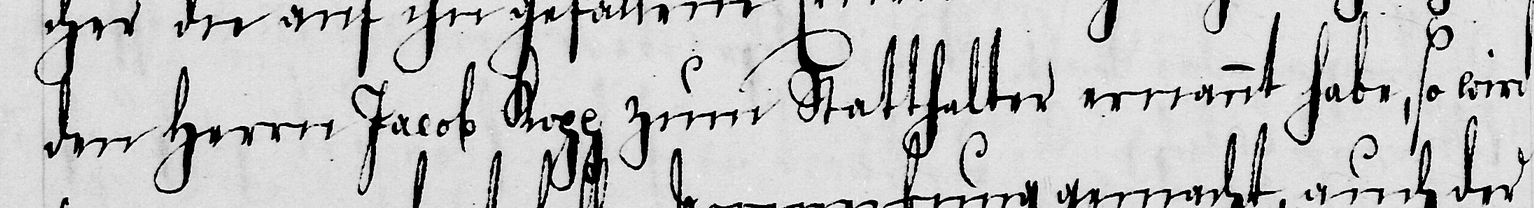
den Herrn Jacob Kopp zum Statthalter ernannt habe,
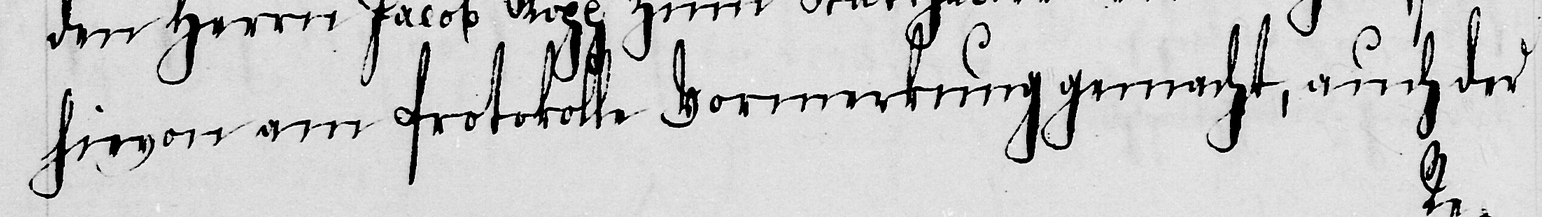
hievon am Protokolle Vormerkung gemacht, auch der
